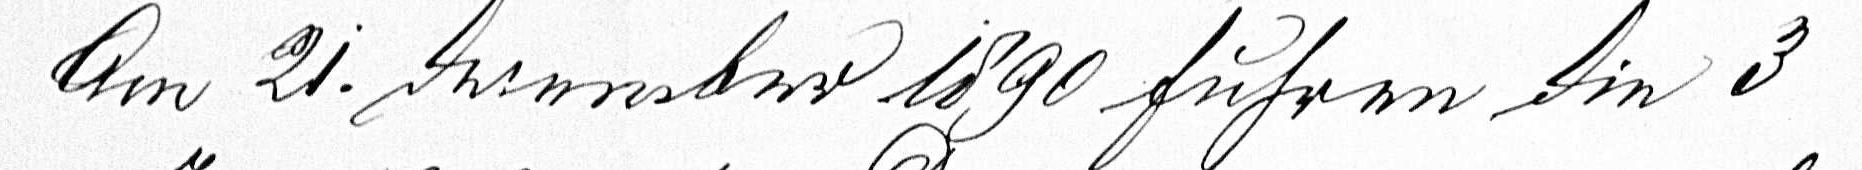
Am 21. Dezember 1890 fuhren die 3
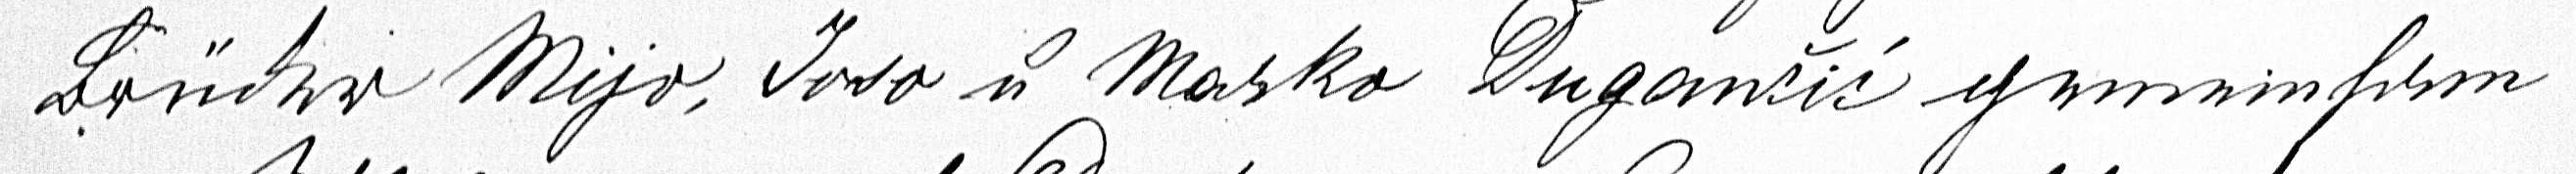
Brüder Mijo, Joso u Marko Dugančić gemeinsam
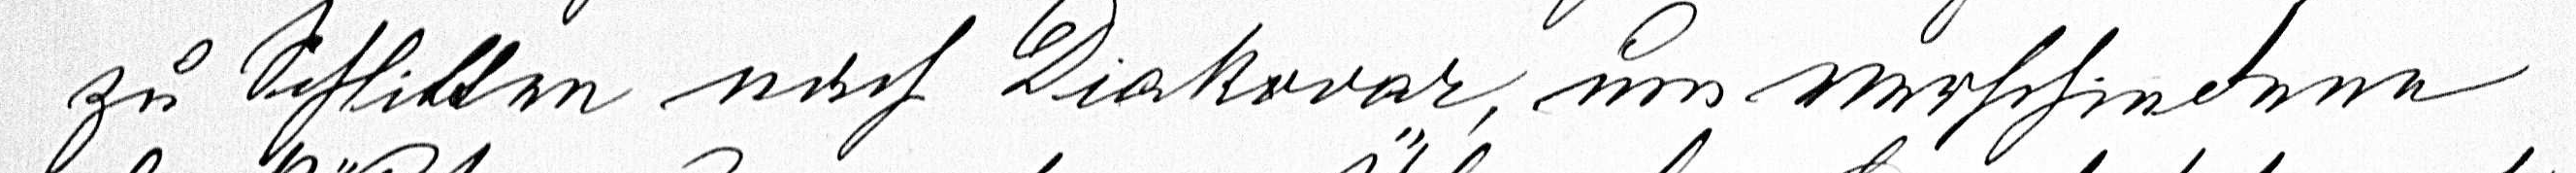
zu Schlitten nach Diakovar, um verschiedene
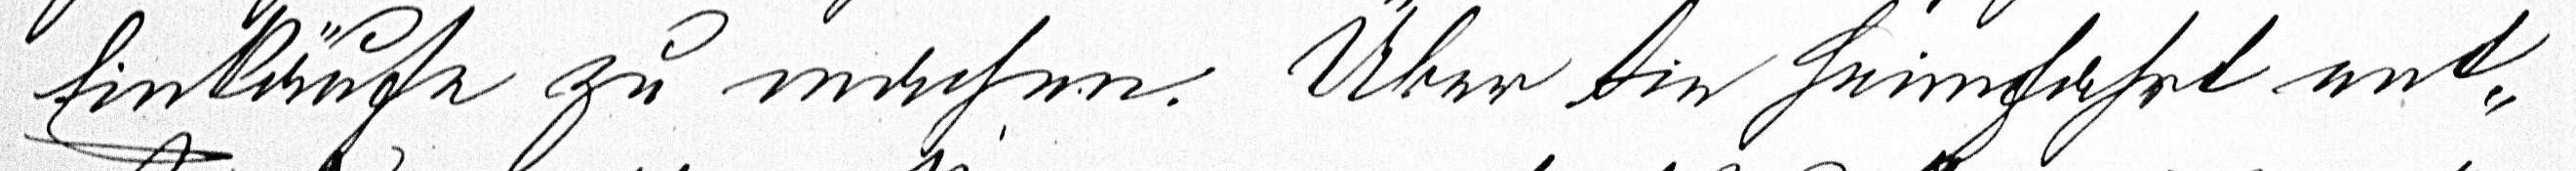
Einkäufe zu machen. Über die Heimfahrt ent¬
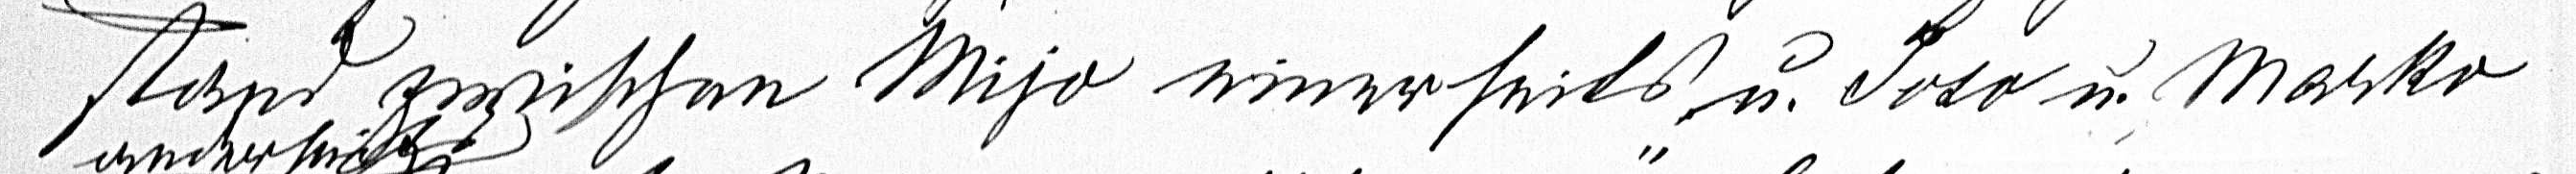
stand zwischen Mijo einerseits u. Joso u. Marko
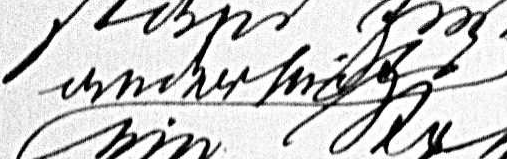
anderseits
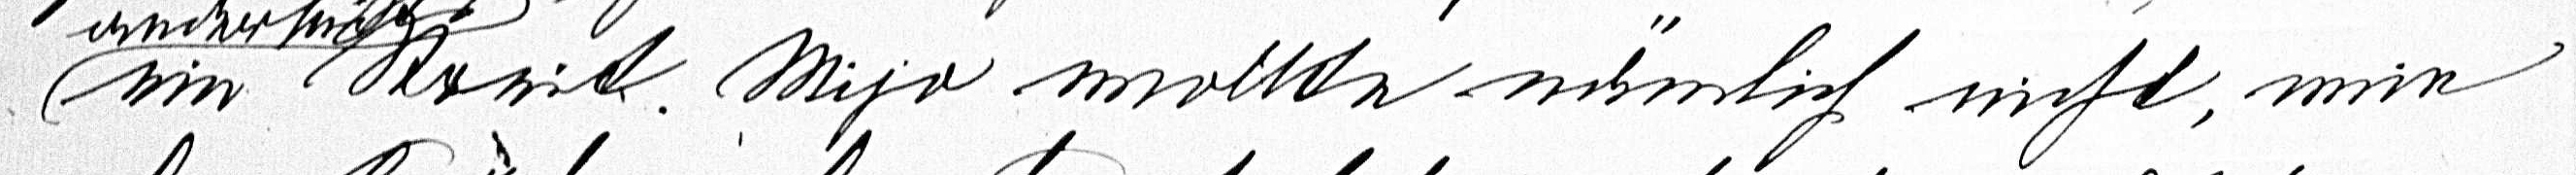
ein Streit. Mijo wollte nämlich nicht, wie
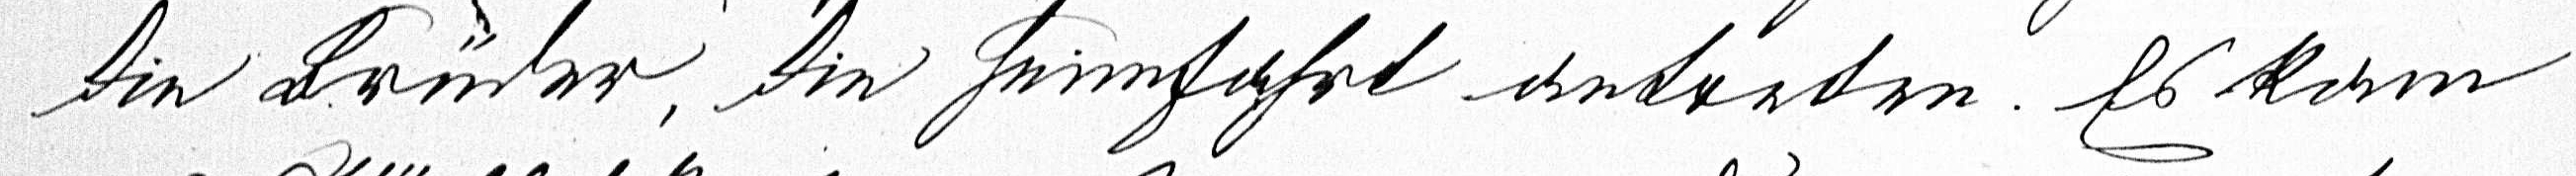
die Brüder, die Heimfahrt antreten. Es kam
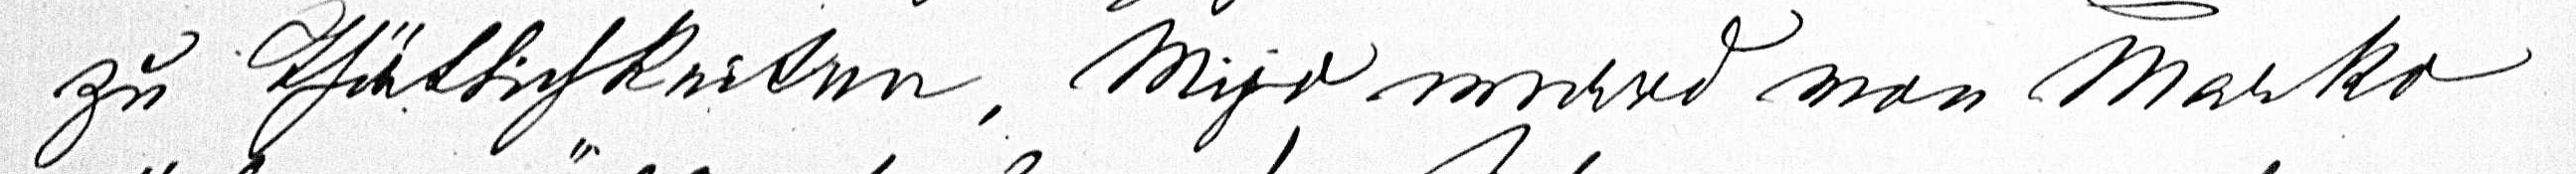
zu Thätlichkeiten, Mijo ward von Marko
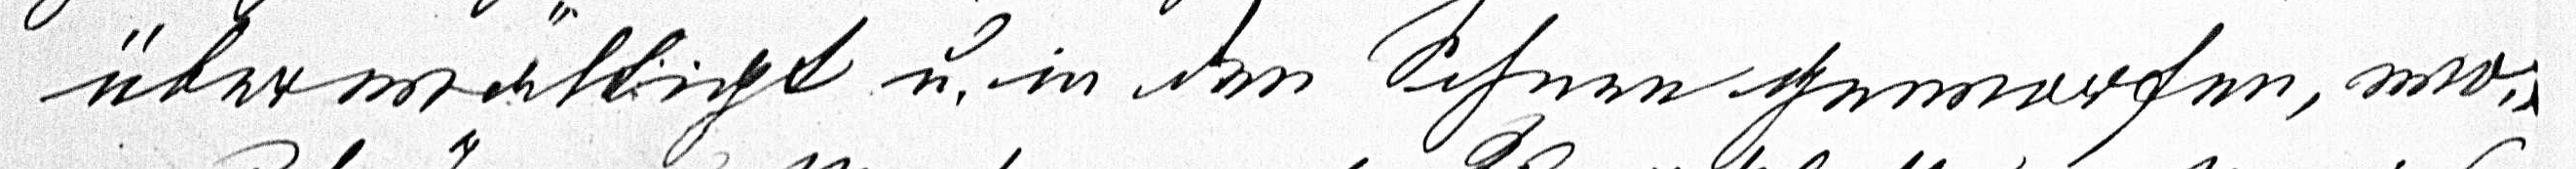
überwältigt u. in den Schnee geworfen, wo¬
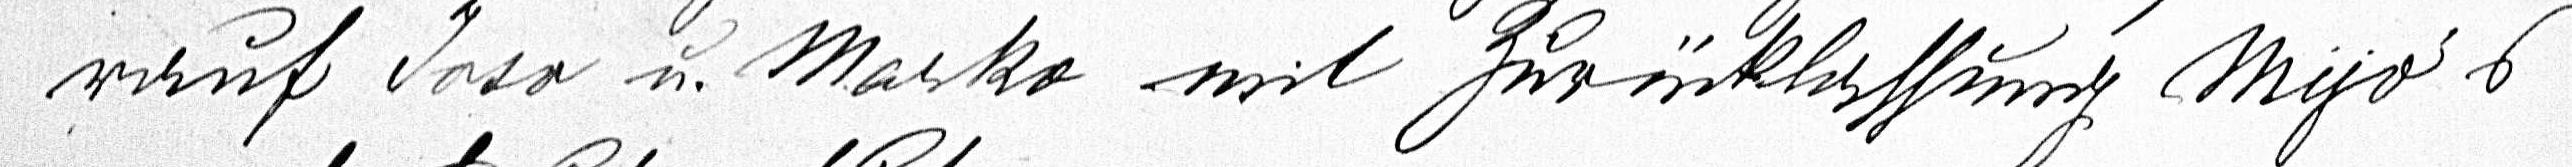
rauf Joso u. Marko mit Zurücklassung Mijos
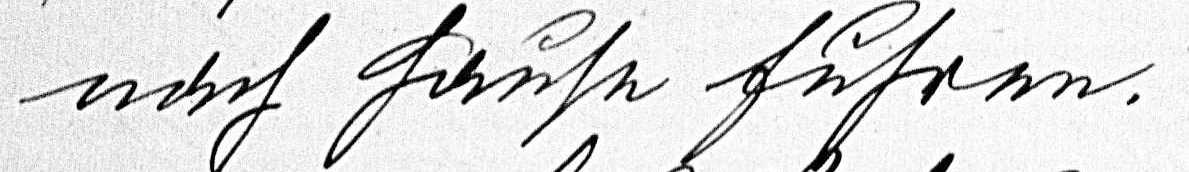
nach Hause fuhren.
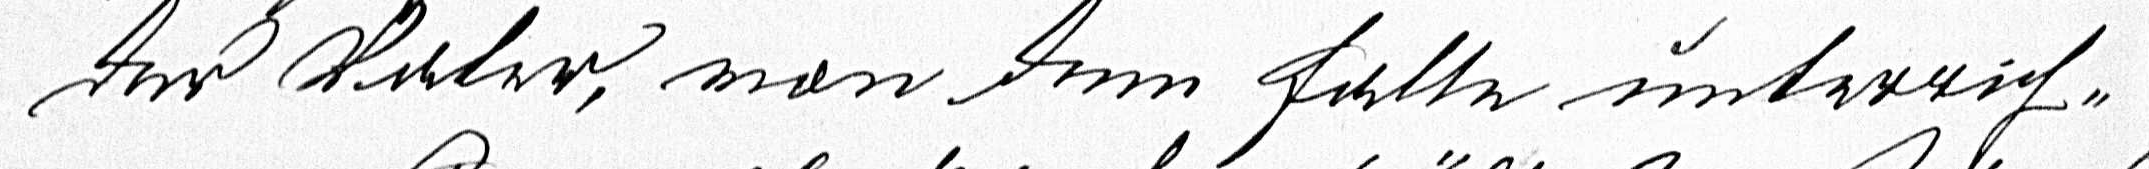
Der Vater, von dem Falle unterrich¬
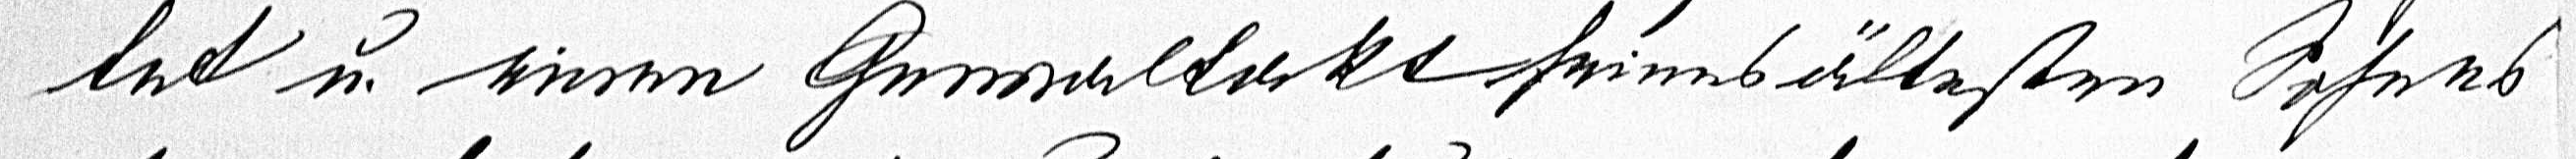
tet u. einen Gewaltakt seines ältesten Sohnes
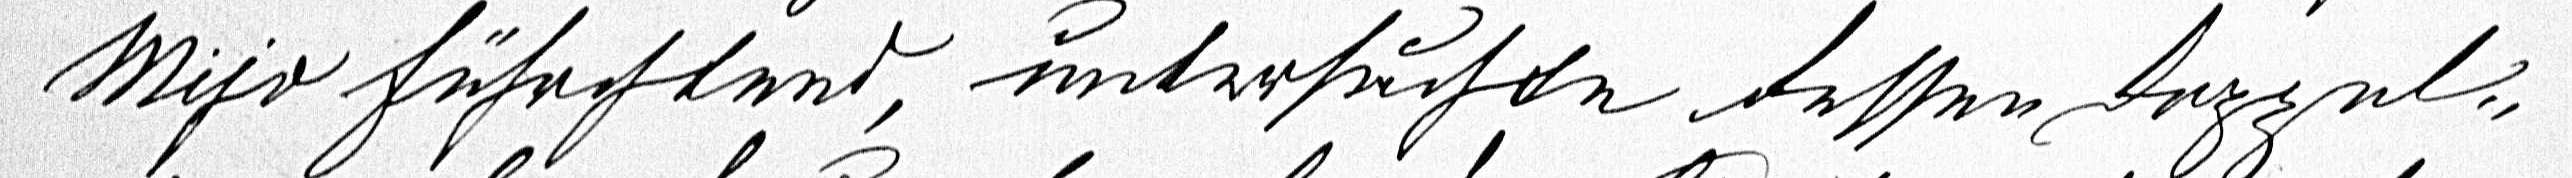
Mijo führchtend, untersuchte dessen Doppel¬
